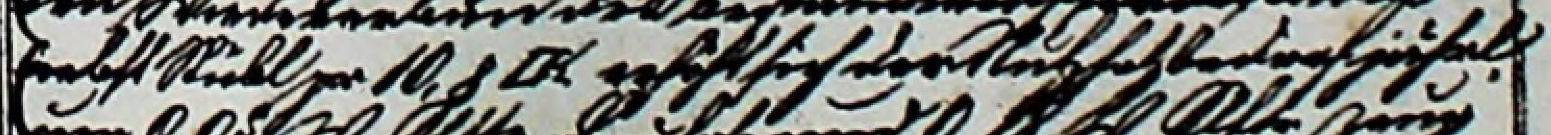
nebst Stübl pr 10,8 K erführ sich der Nutsch??? jährl.
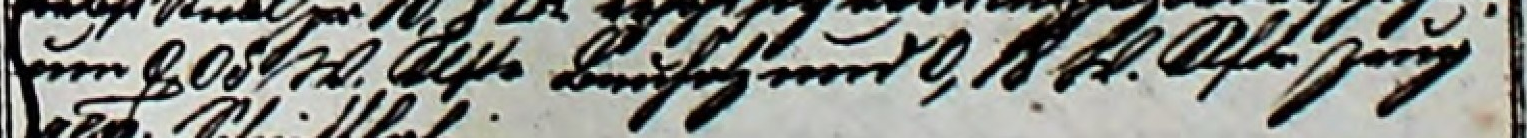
um 0,05 W. Stftr Bauholz und 0,18 W. Stftr
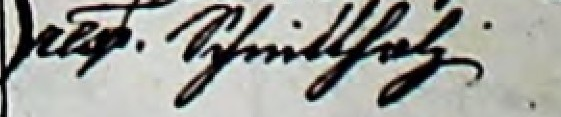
zeug resp. Schnittholz
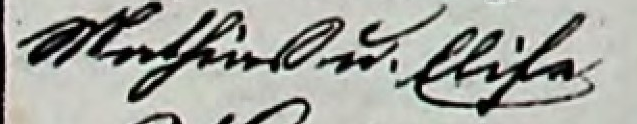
Mathäus u. Elise
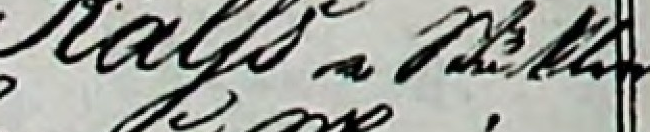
Kalss v Stukten
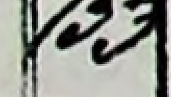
133
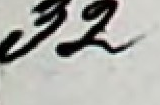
32
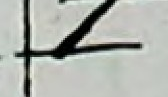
I
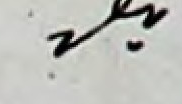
Do
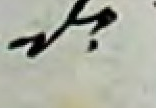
Do
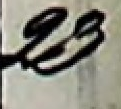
23
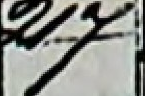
217
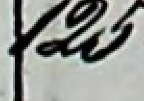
125
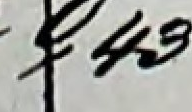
0,43
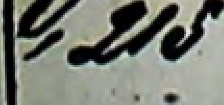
0,215
